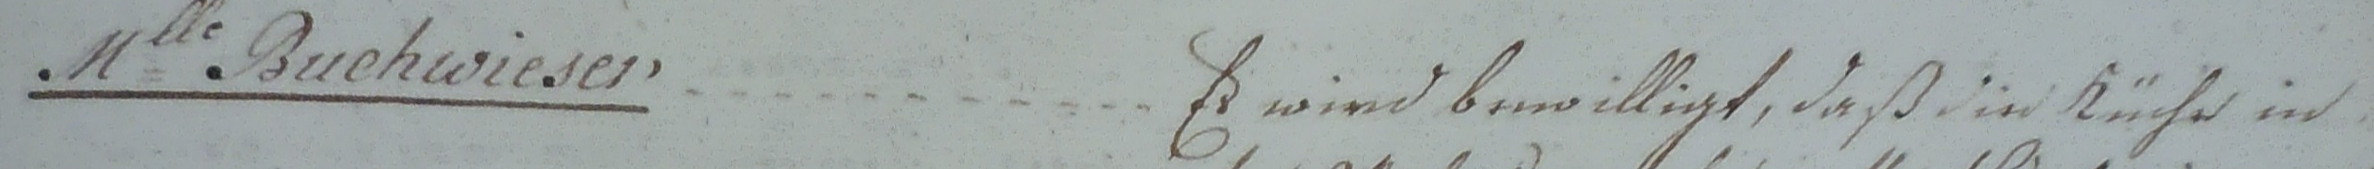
Ml͇le Buchwieser ……….. Es wird bewilligt, daß die Küche in
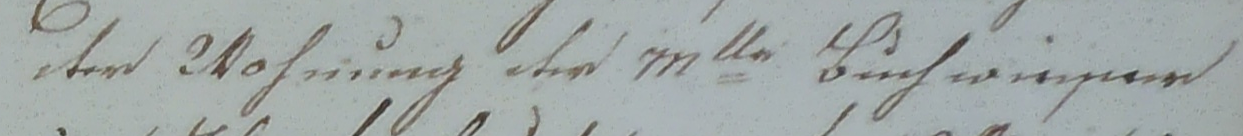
der Wohnung der Mll͇e Buchwieser
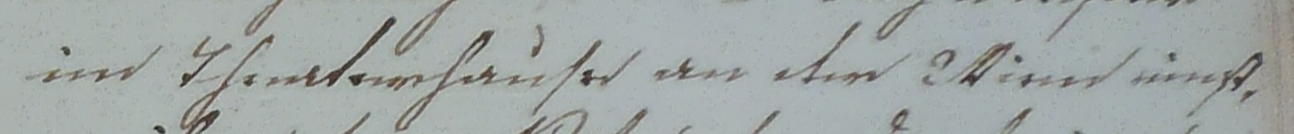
im Theaterhause an der Wien einst¬
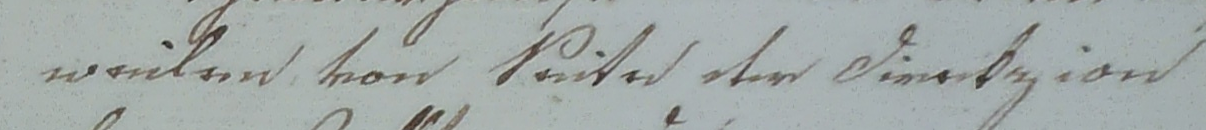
weilen von Seite der Direkzion
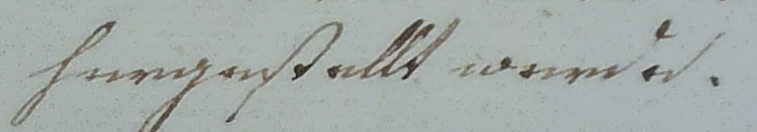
hergestellt werde.
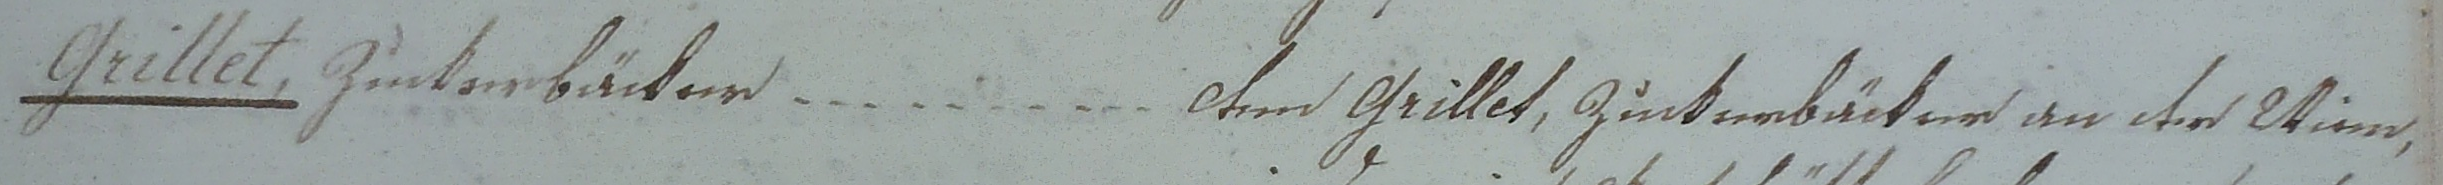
Grillet, Zuckerbäcker ……….. Dem Grillet, Zuckerbäcker an der Wien,
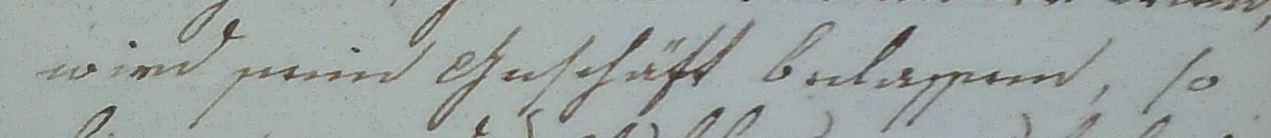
wird sein Geschäft belassen, so
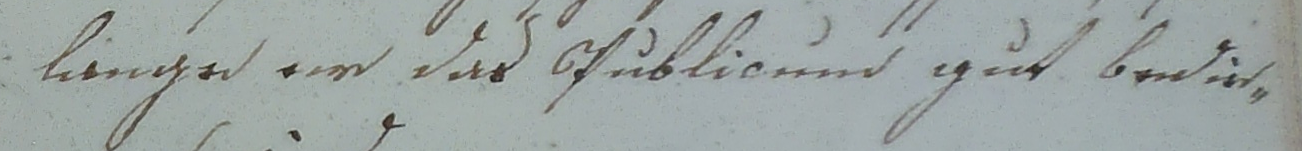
lange er das Publicum gut bedie¬
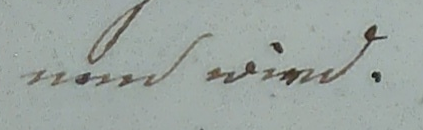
nen wird.
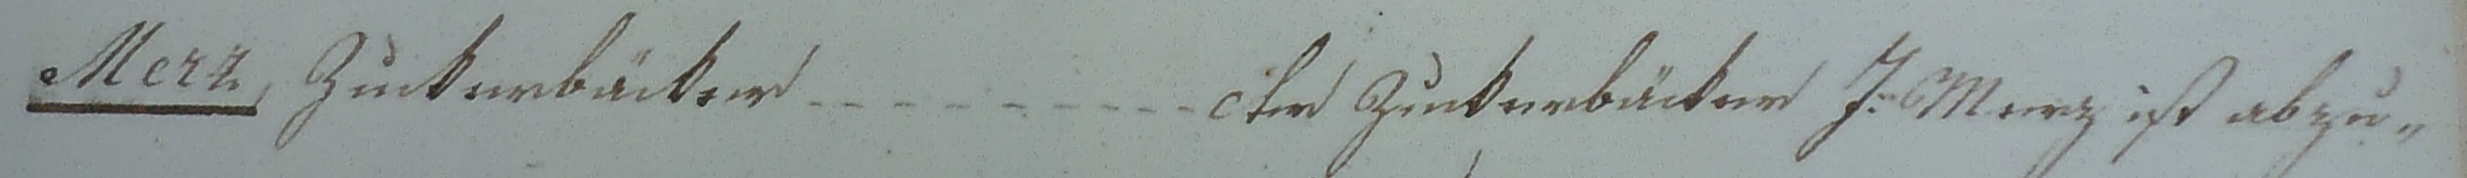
Merz, Zuckerbäcker ………. Der Zuckerbäcker J: Merz ist abzu¬
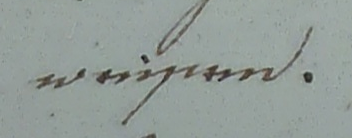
weisen.
